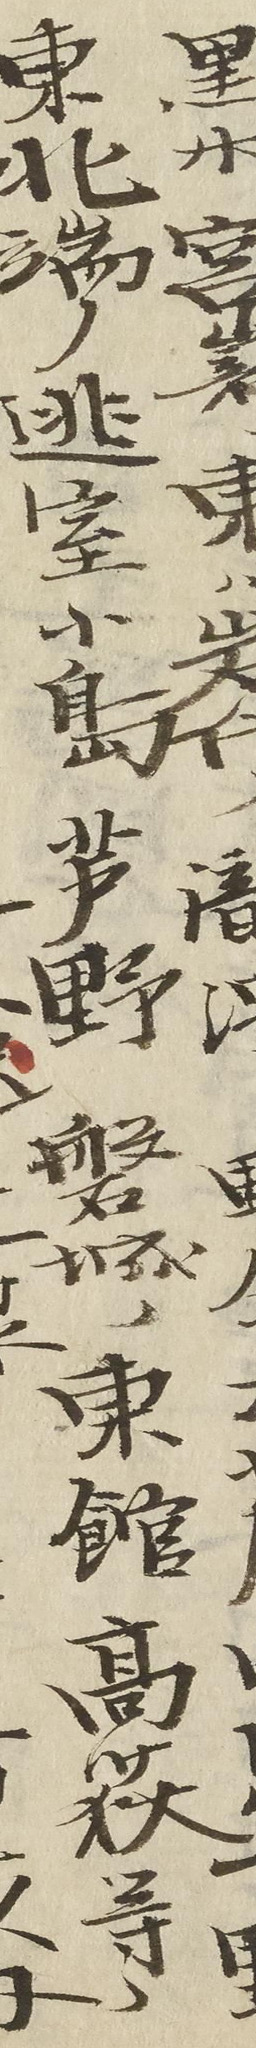東北端ノ逃室小島芦野磐城ノ東館高萩等ノ
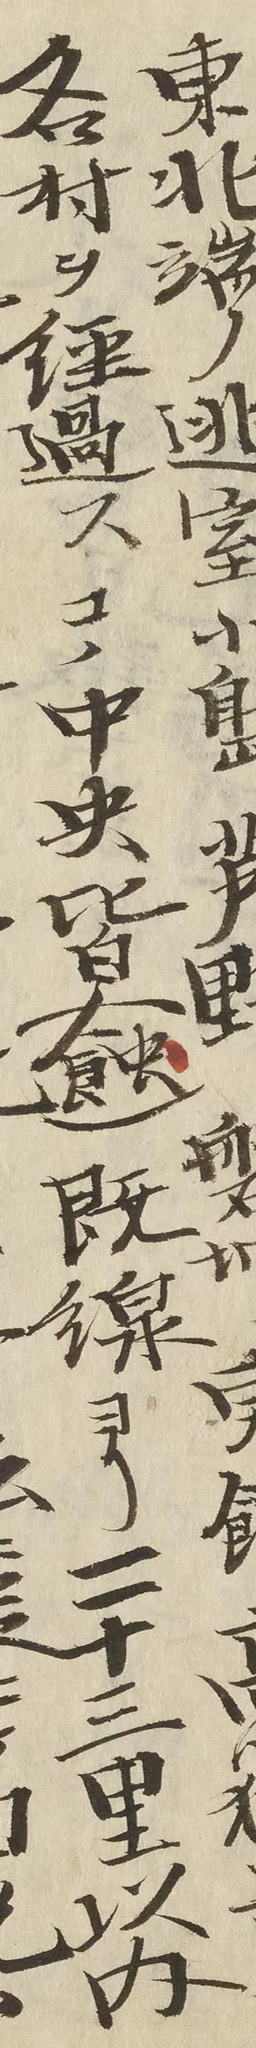各村ヲ経過スコノ中央皆既線ヨリ二十三里以内
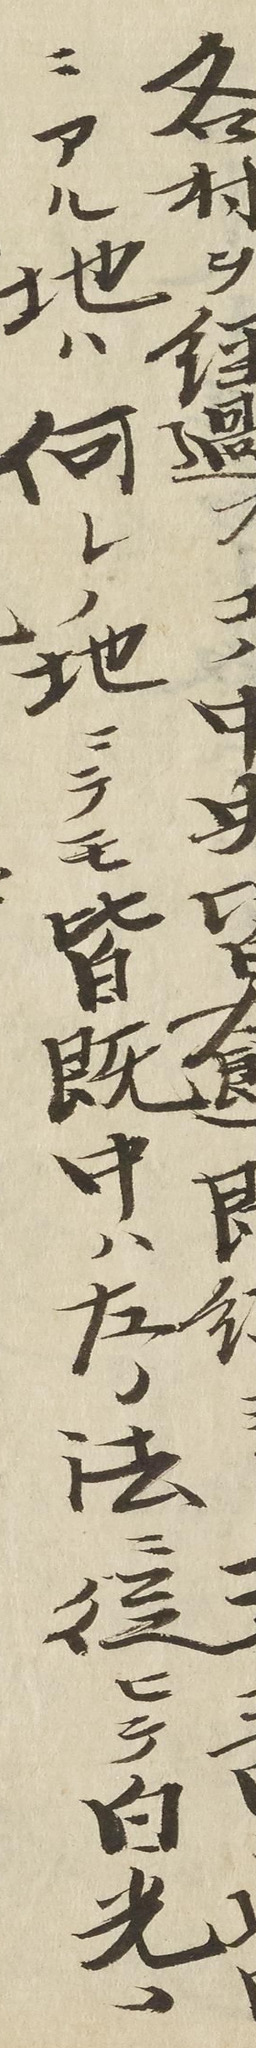ニアル地ハ何レノ地ニテモ皆既中ハ左ノ法ニ従ヒテ白光ノ
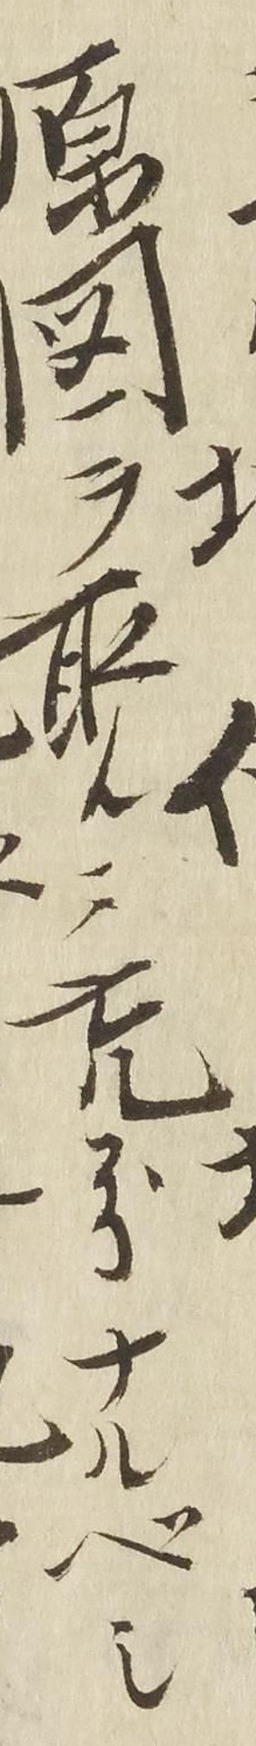原図ヲ取ルニ充分ナルベシ
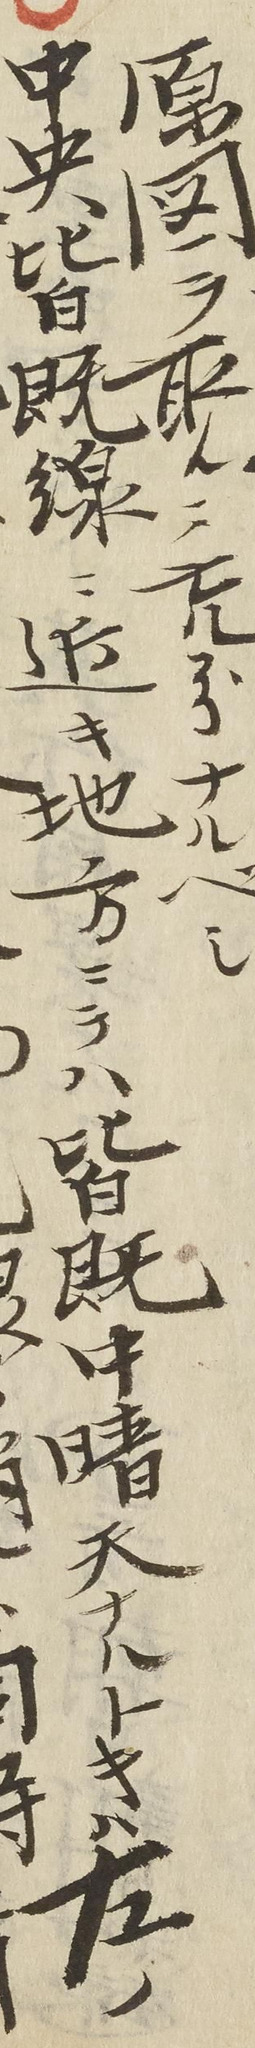○中央皆既線ニ近キ地方ニテハ皆既中晴天ナルトキハ左ノ
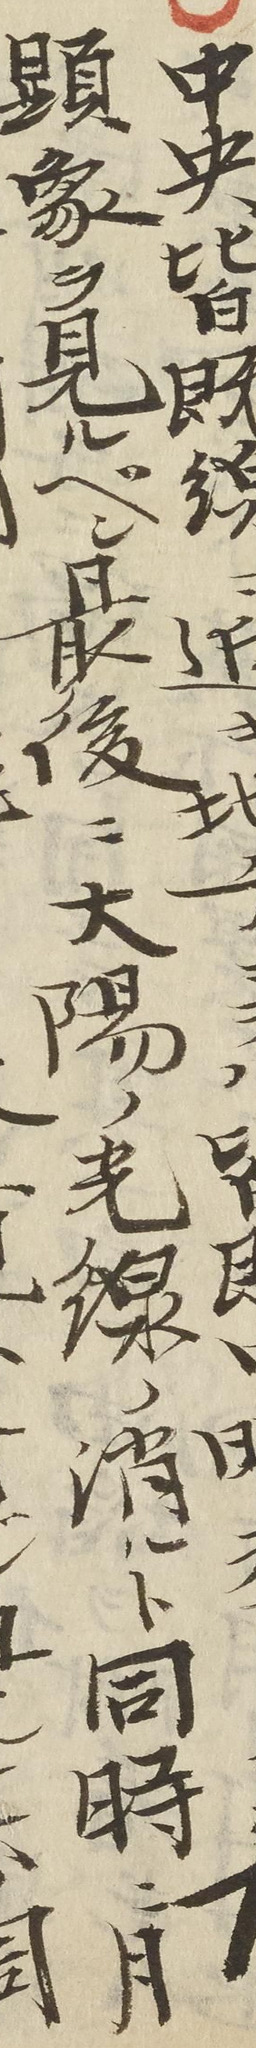顕象ヲ見ルベシ最後ニ大陽ノ光線ノ消ルト同時ニ月
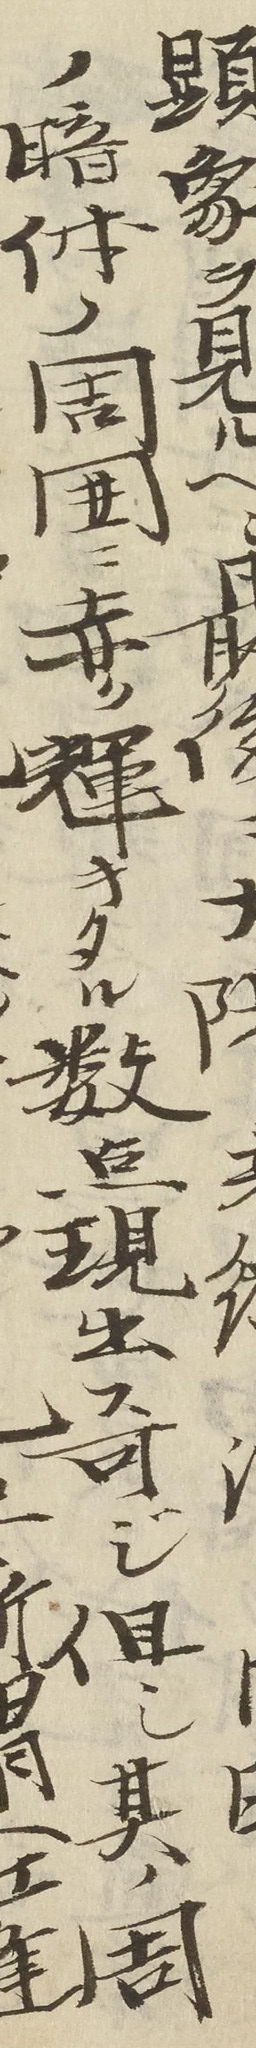ノ暗体ノ周囲ニ赤ク輝キタル数点現出ス可ジ但シ其ノ周
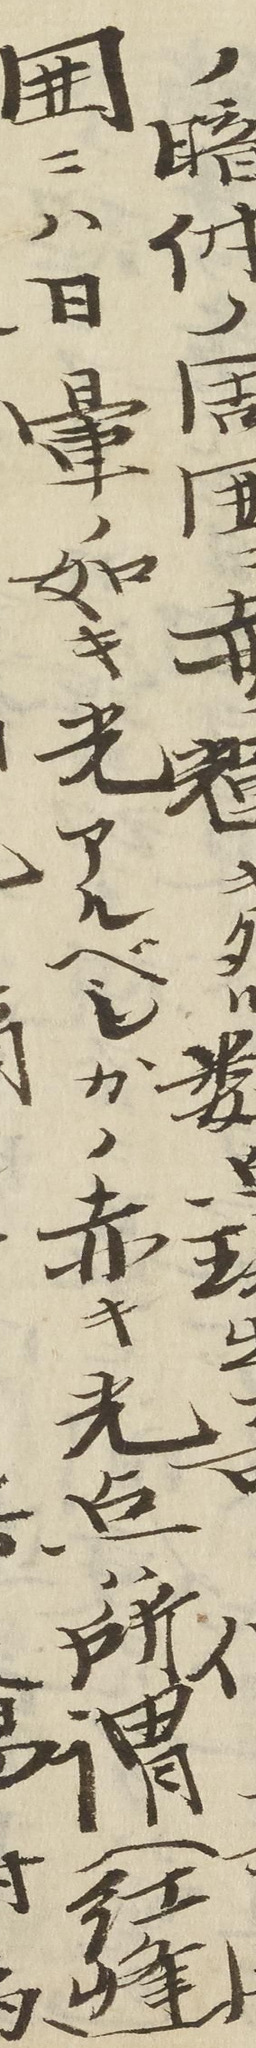囲ニハ日暈ノ如キ光アルベシカノ赤キ光点ハ所謂
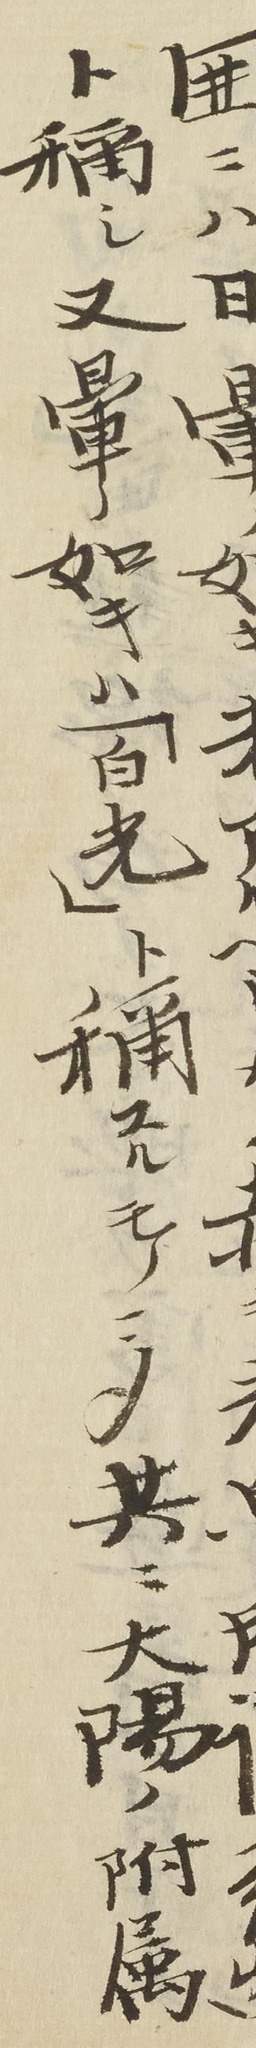ト称シ又暈ノ如キハ「白光」ト称スルモノニシテ共ニ大陽ノ付属
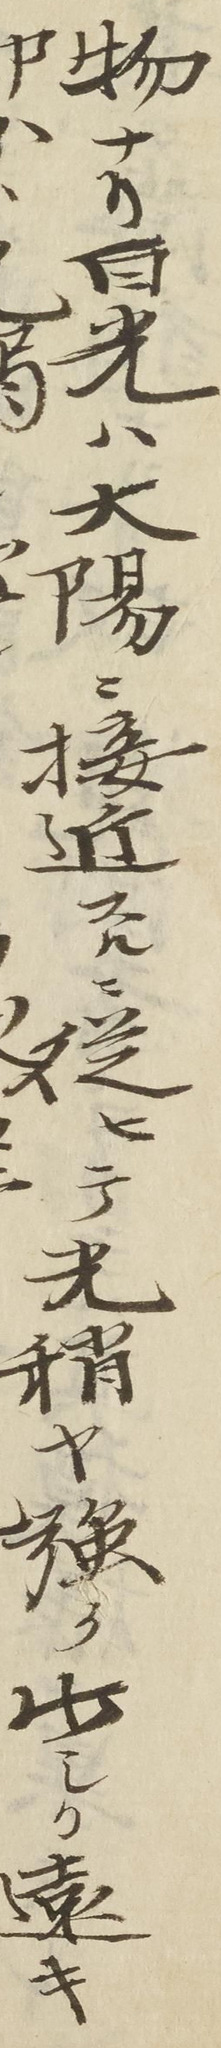物ナリ白光ハ大陽ニ接近スルニ従ヒテ光稍ヤ強ク出シリ遠キ
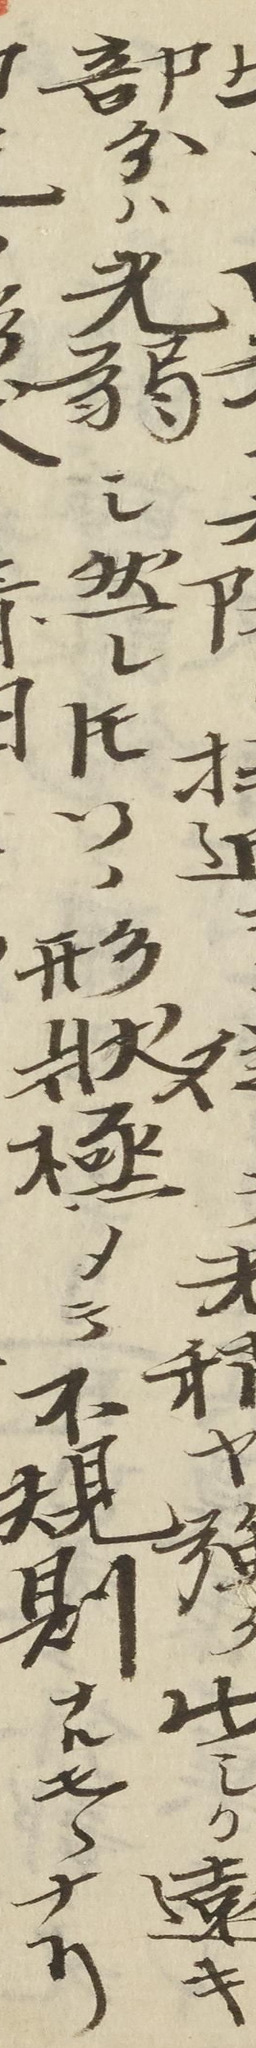部分ハ光弱シ然レ共ソノ形状極メテ不規則ナルモノナリ
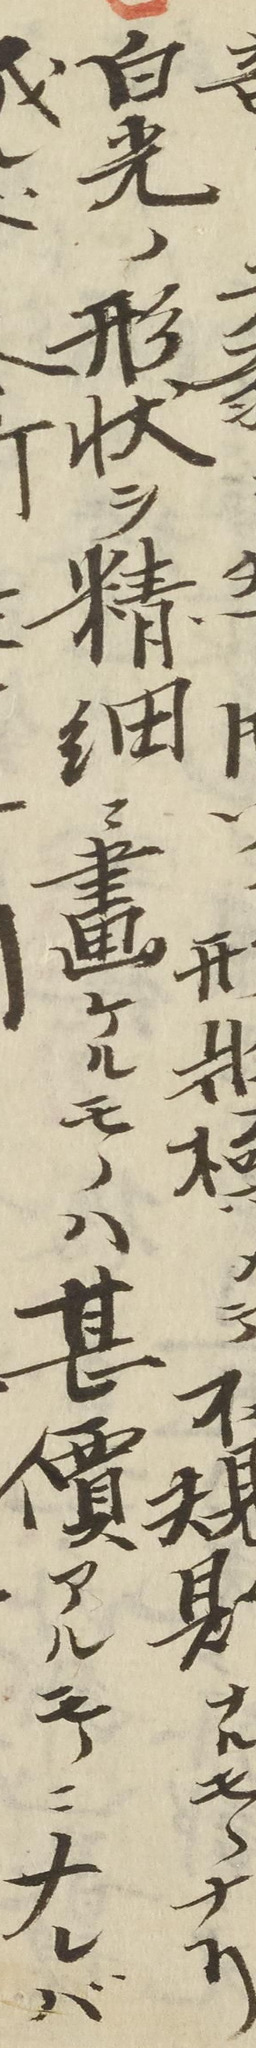○白光ノ形状ヲ精細ニ画ケルモノハ甚価アルモノニナレバ
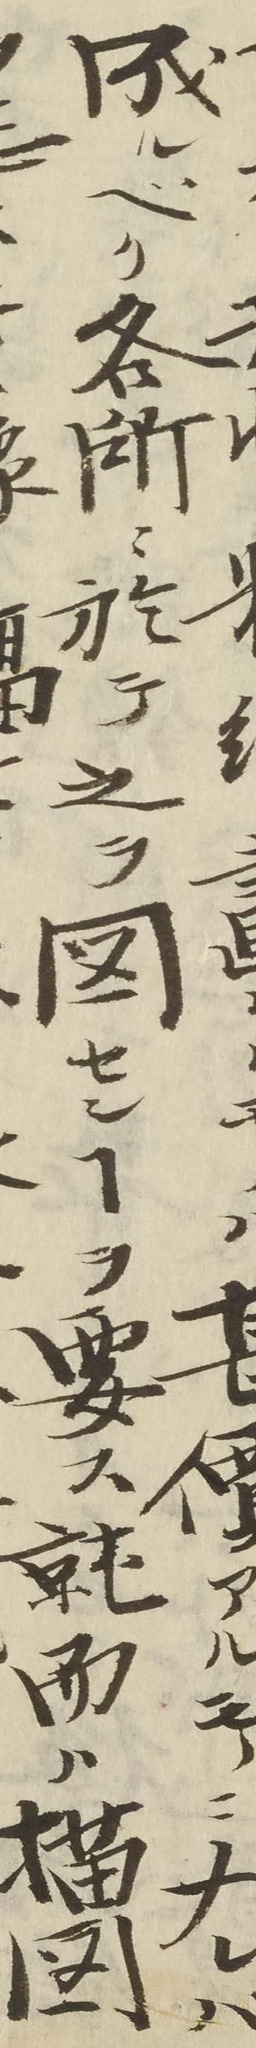成ルベク各所ニ於テ之ヲ図セシコトヲ要ス就而ハ描図
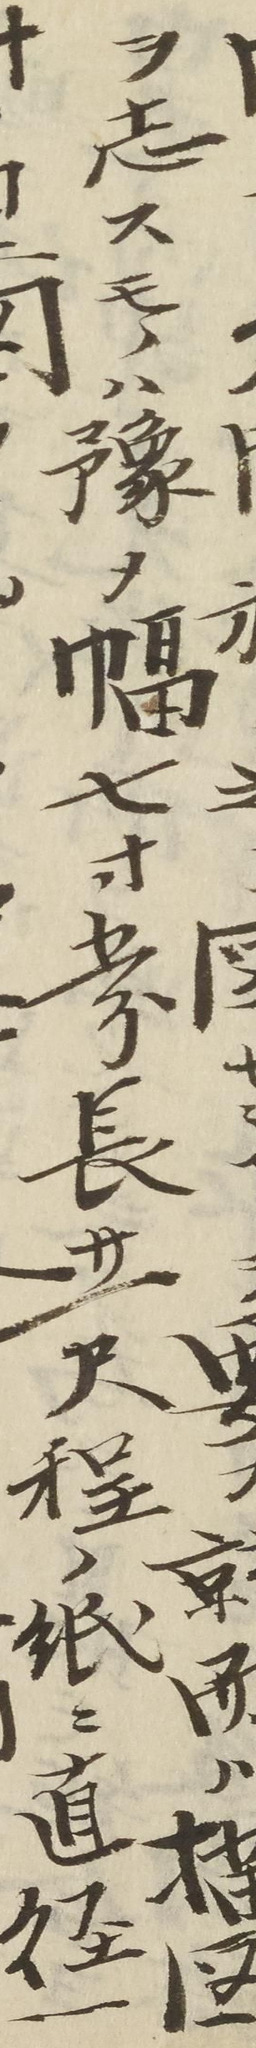ヲ志スモノハ予メ幅七寸五分長サ一尺程ノ紙ニ直径一
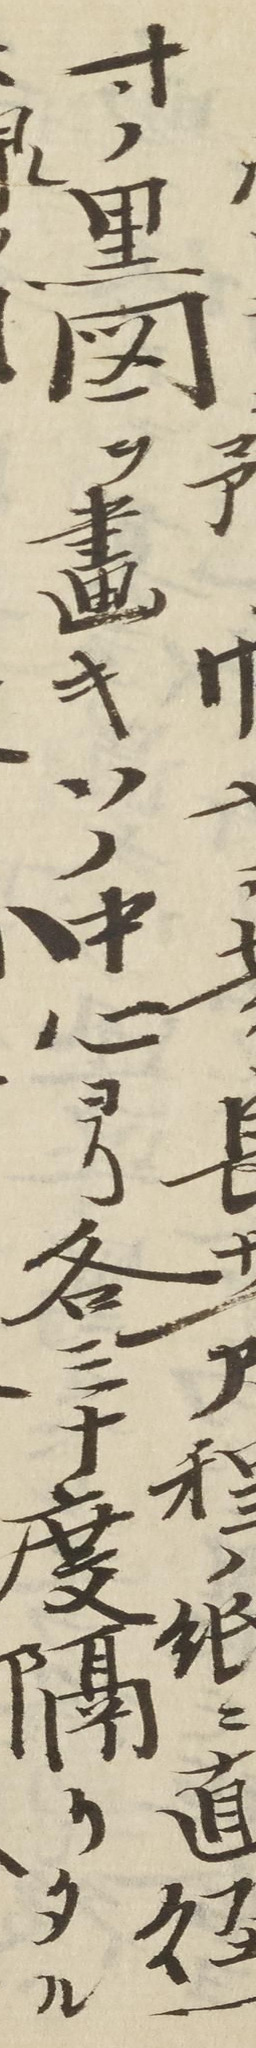寸ノ黒図ヲ画キソノ中心ヨリ各三十度隔リタル
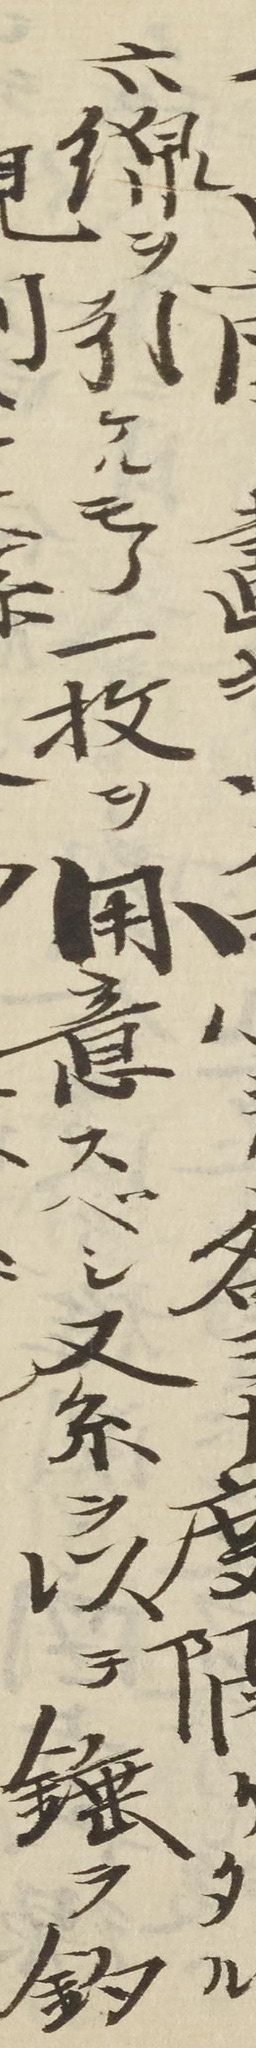六線ヲ引ケルモノ一枚ヲ用意スベシ又糸ヲ以テ錘ヲ釣
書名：日蝕録　全
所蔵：東京大学地震研究所図書室 Earthquake Research Institute Library, The University of Tokyo, JAPAN
